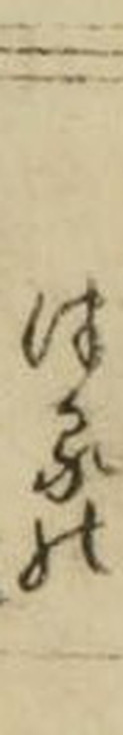つるの
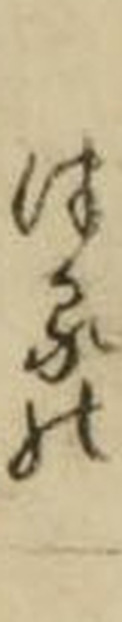つるの
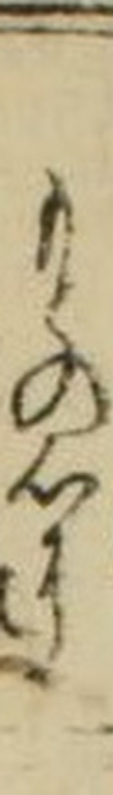もとの心に
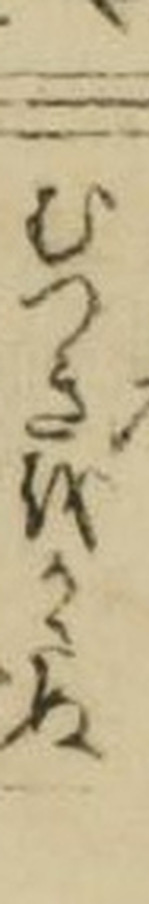むつきをかさぬ
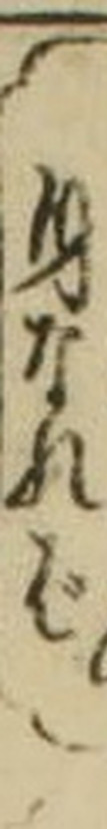身なれば
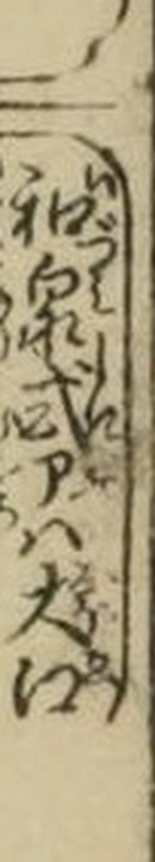和泉式部は大江
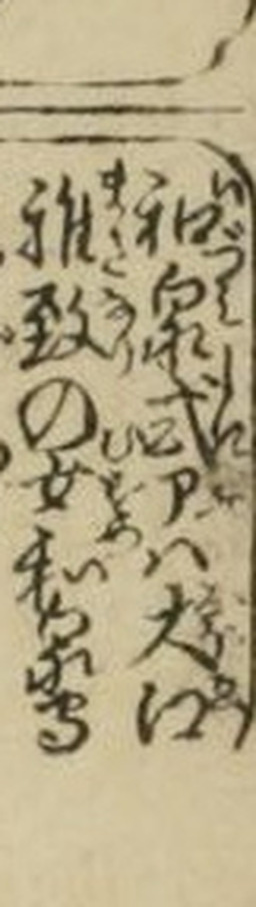雅致の女和泉守
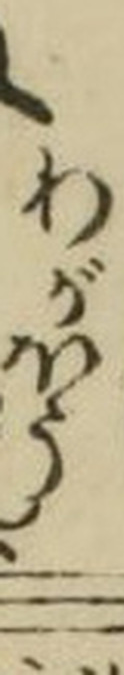わがほう
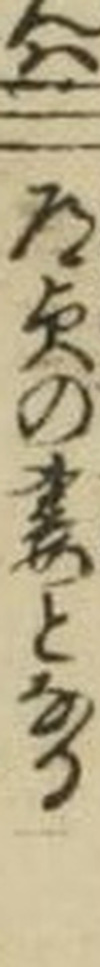道貞の妻となる
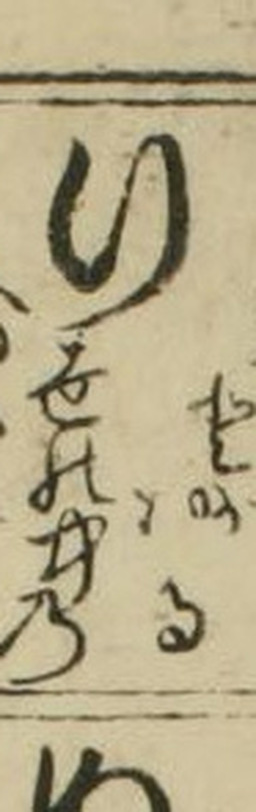世の中の
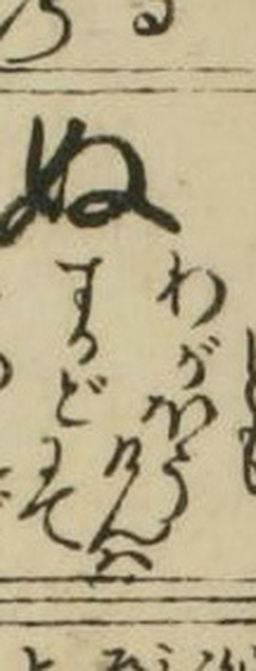するどにて
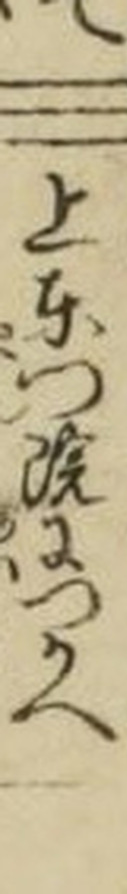上東門院につかへ
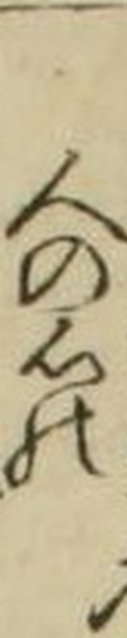人の心の
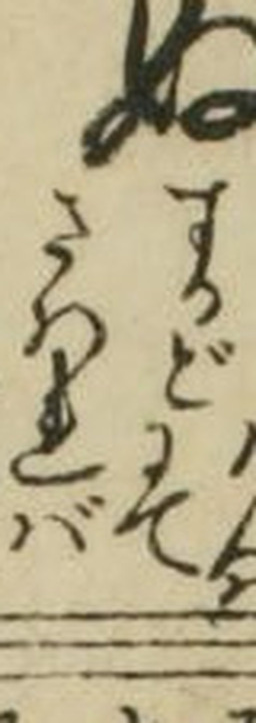さわれば
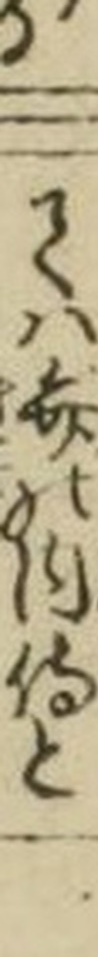ては弁の内侍と
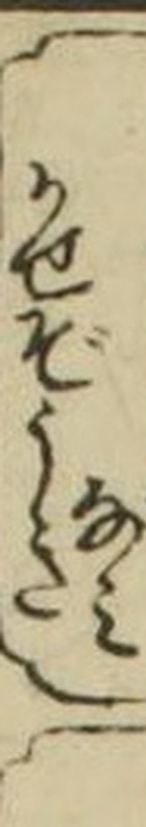かぜぞうき
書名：女源氏教訓鑑
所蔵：東京学芸大学附属図書館
